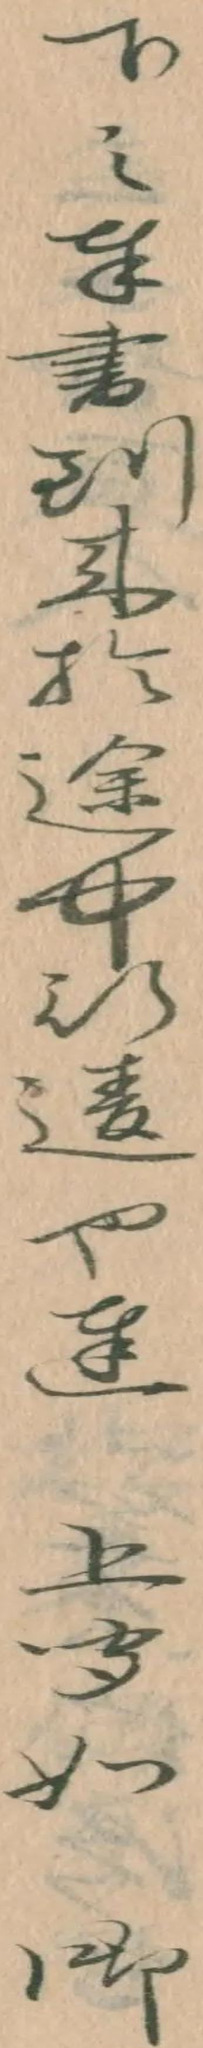下之奉書到来於途中行違や達上聞如御
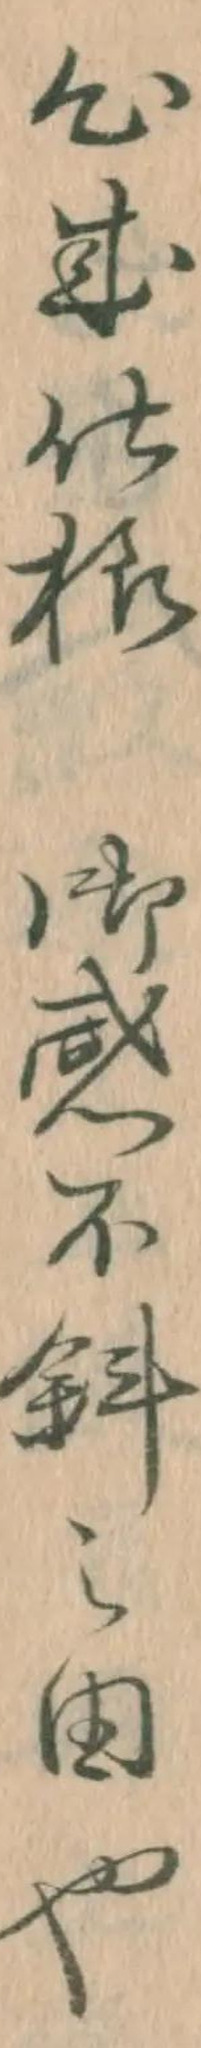心成仕様御感不斜之由也
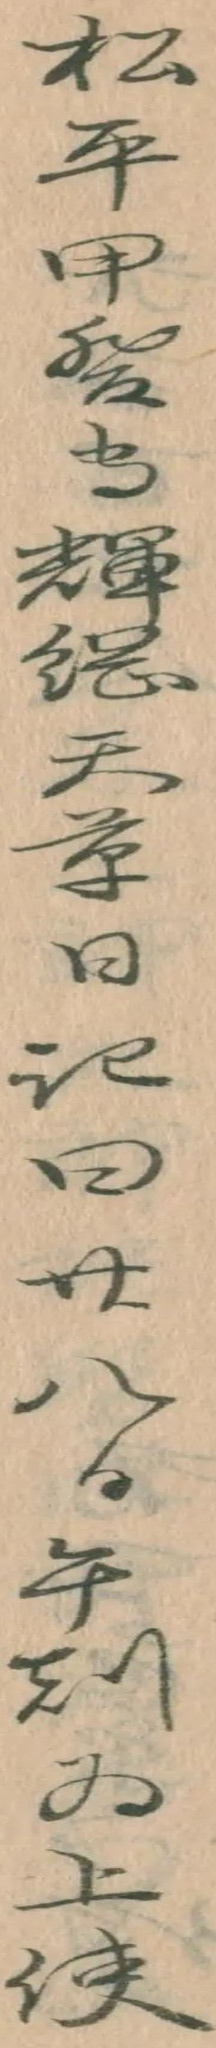松平甲斐守輝綱天草日記曰廿八日午刻ゐ上使
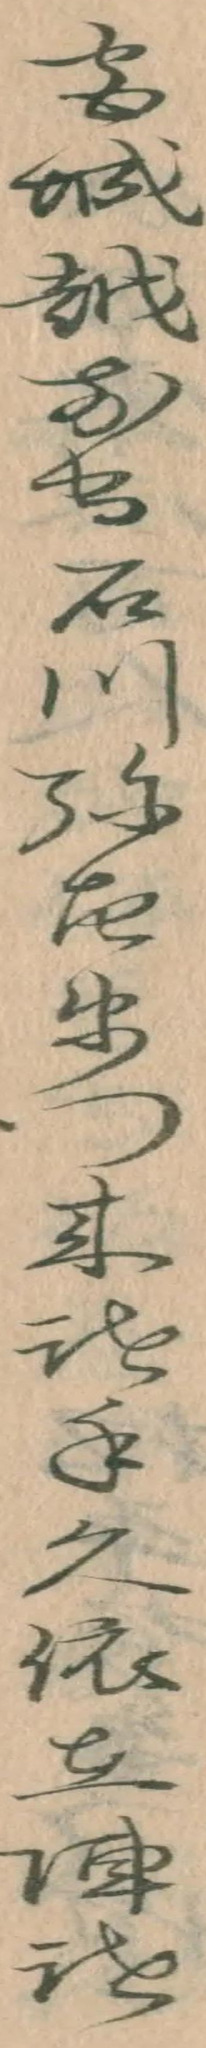宮城越前守石川弥左衛門来諸手久依在陣諸
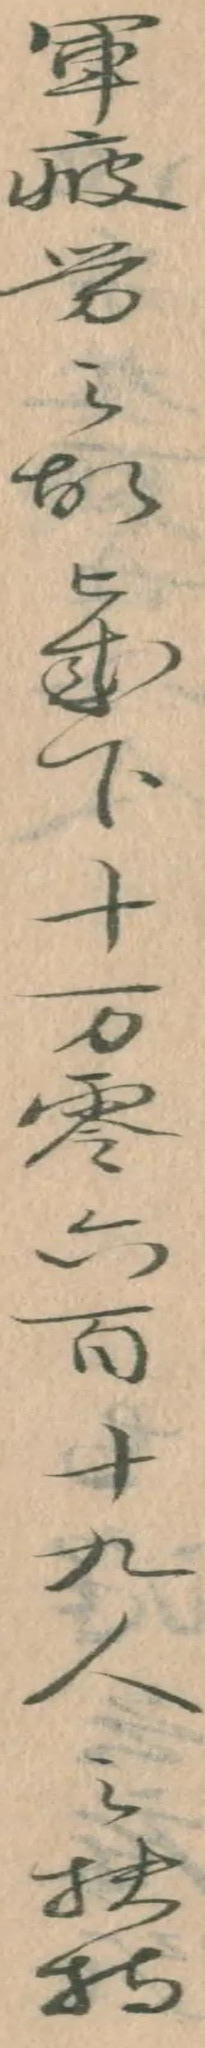軍疲労之故被成下十万零六百十九人之扶持
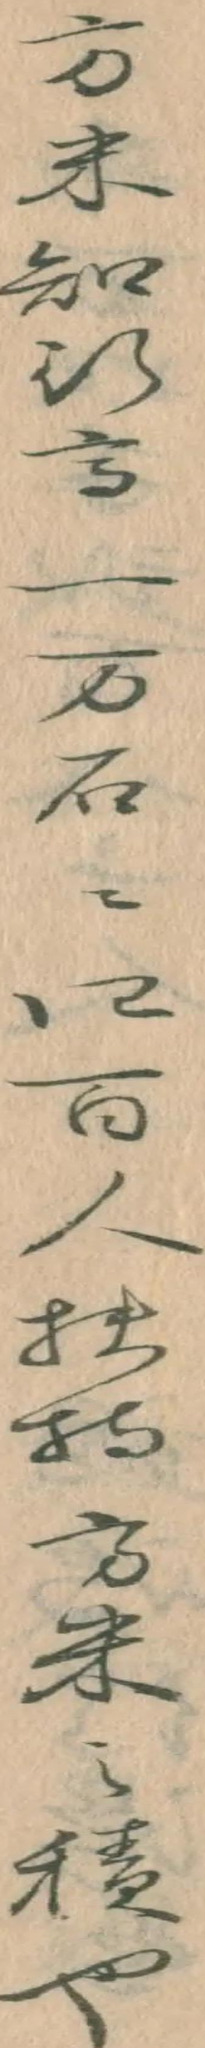方未知行高一万石に四百人扶持方米之積也
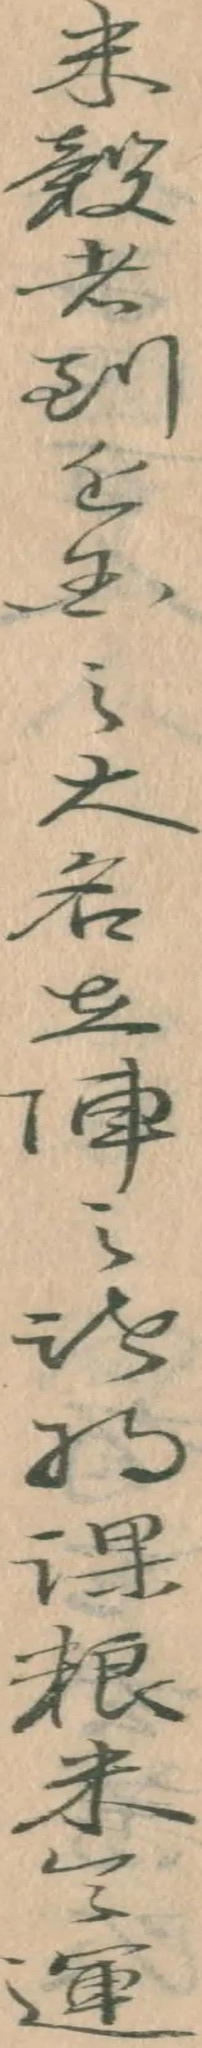米穀者到近国之大名在陣之諸将課粮米令運
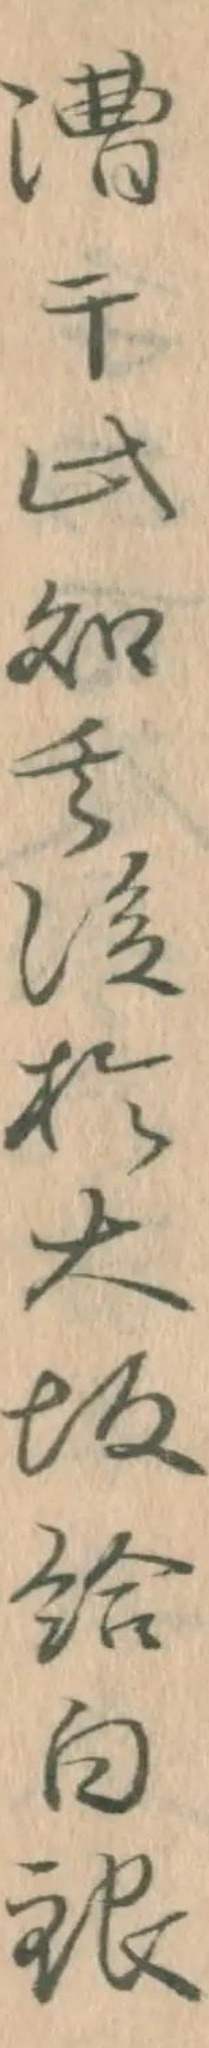漕干此所処其後於大坂給白銀
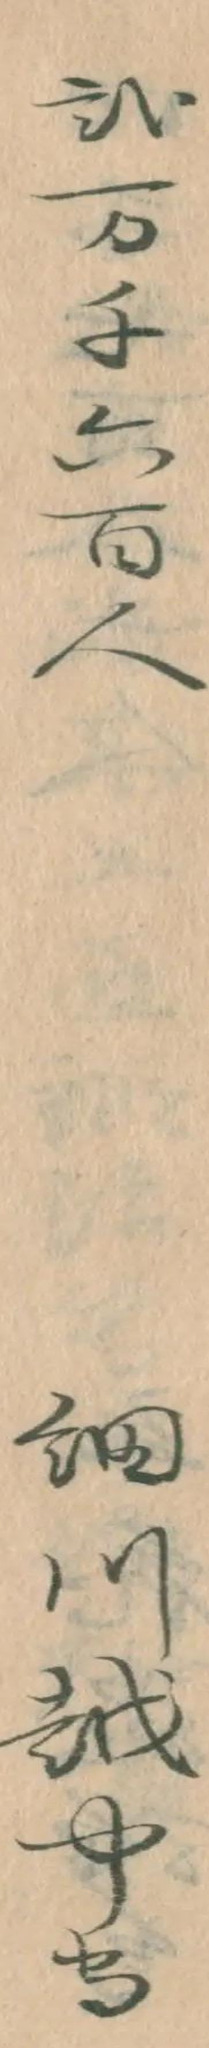弐万千六百人細川越中守

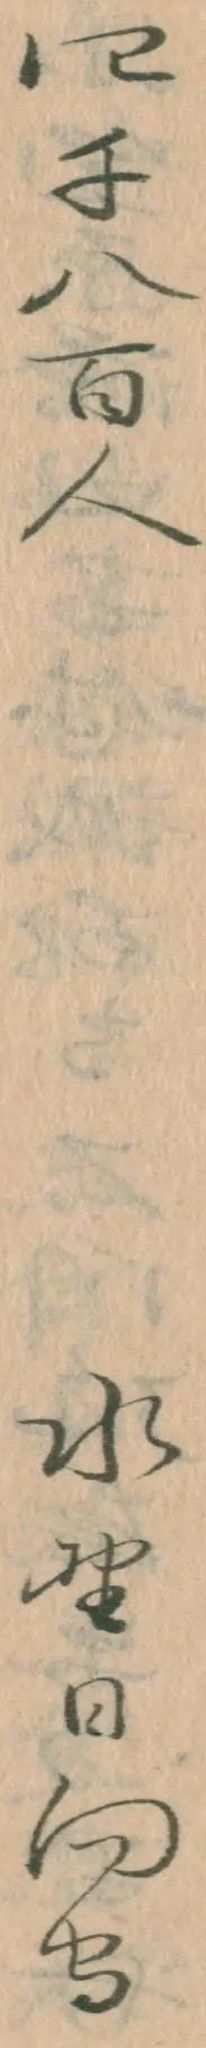四千八百人水野日向守
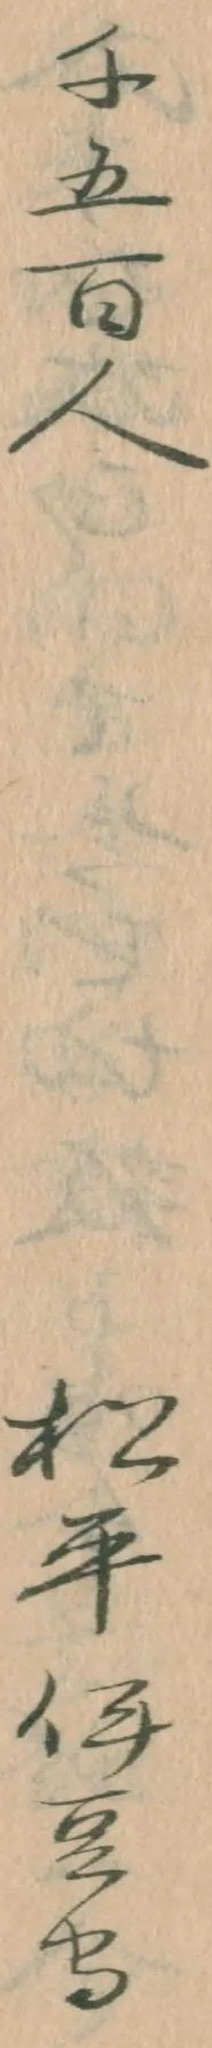千五百人松平伊豆守
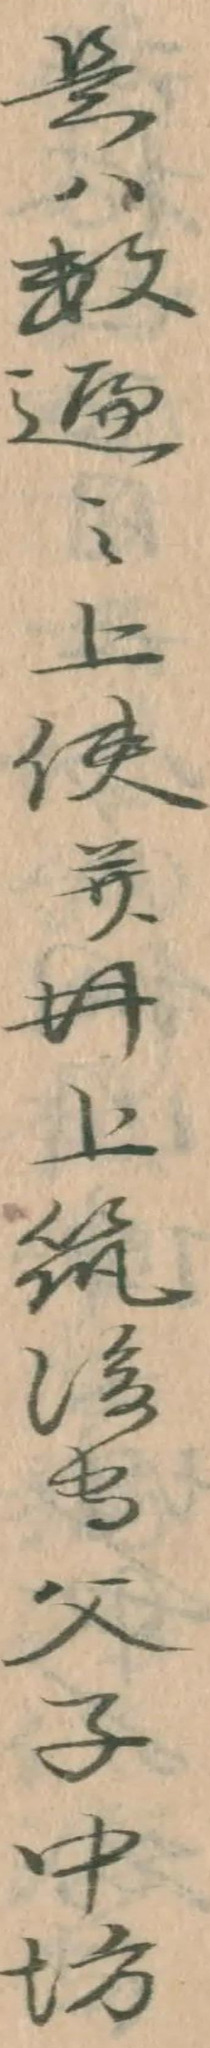是は数遍之上使幷井上筑後守父子中坊
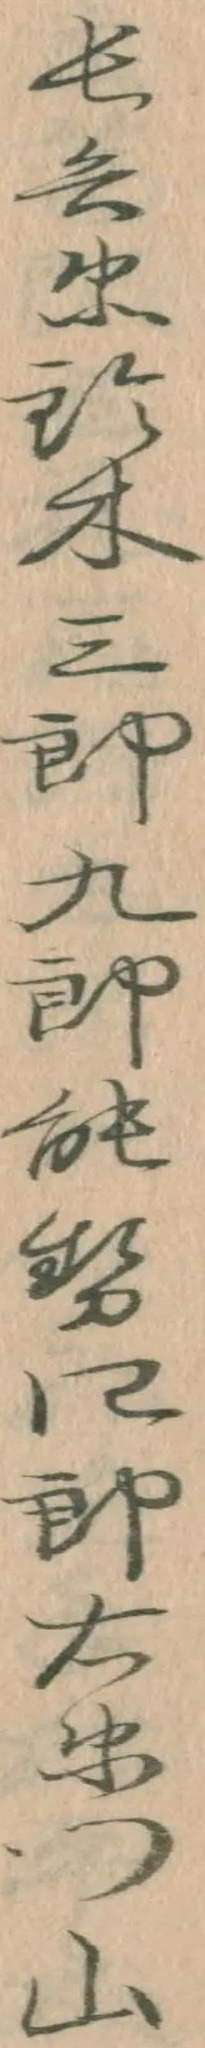長兵衛鈴木三郎九郎能勢四郎右衛門山
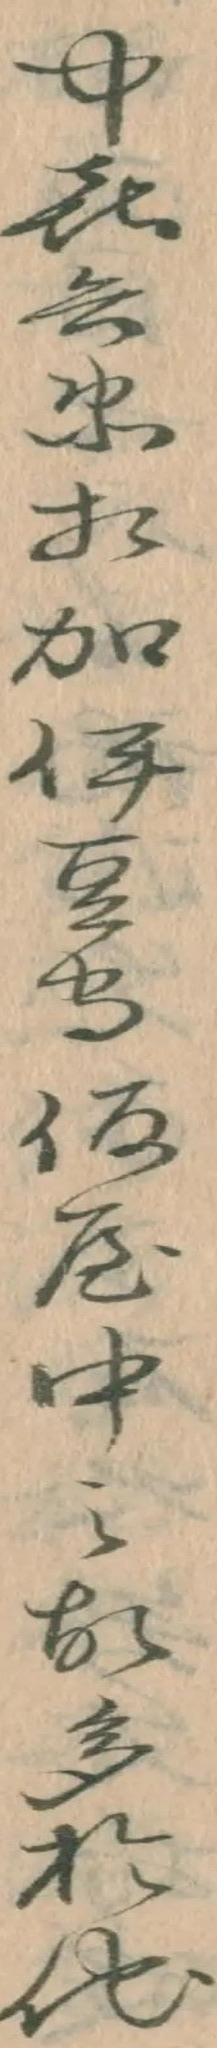中喜兵衛相加伊豆守仮屋中之故多於他
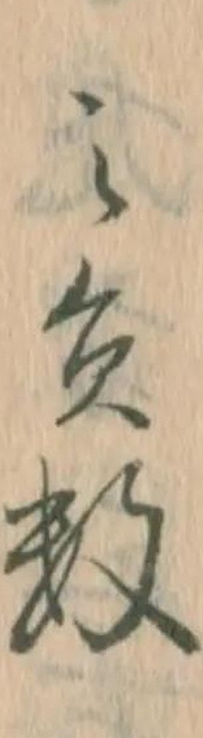之員数
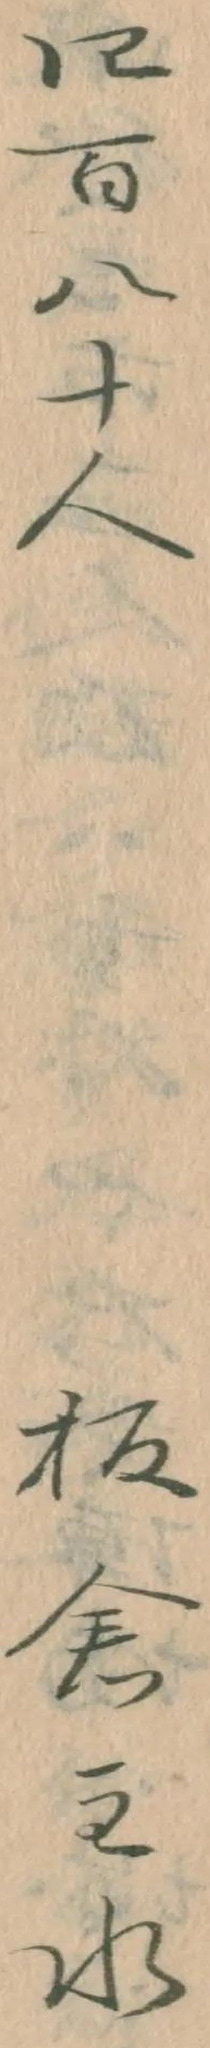四百八十人板倉主水
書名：切支丹御退治記 49巻. [6]
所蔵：国立国会図書館 National Diet Library, JAPAN
